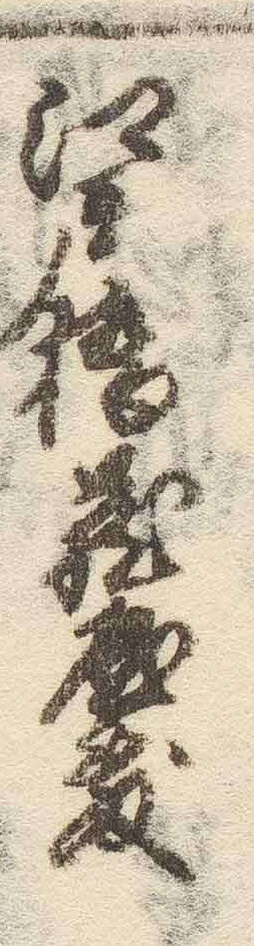江戸橋蔵屋敷
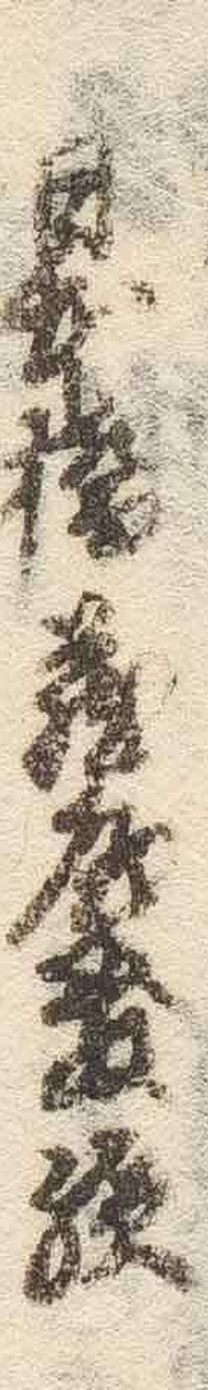日本橋蔵屋敷続
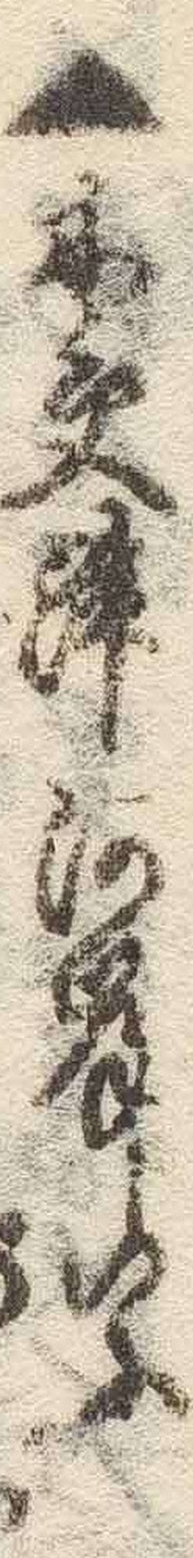▲木更津河岸トいふ
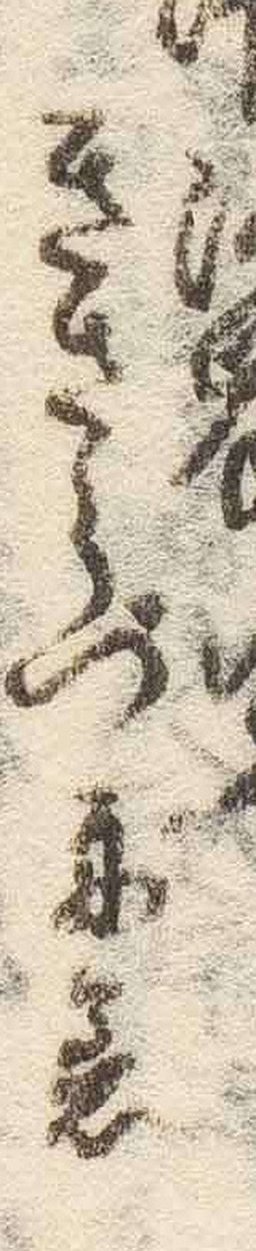きさらづ舟着
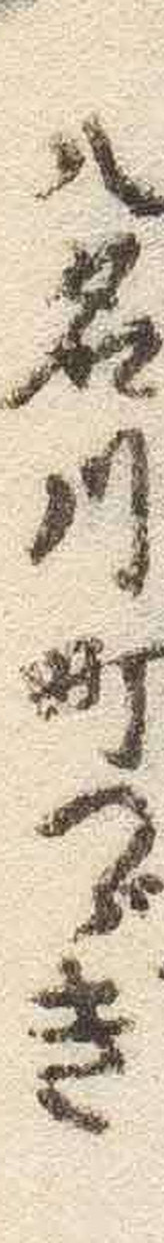八名川町つゞき
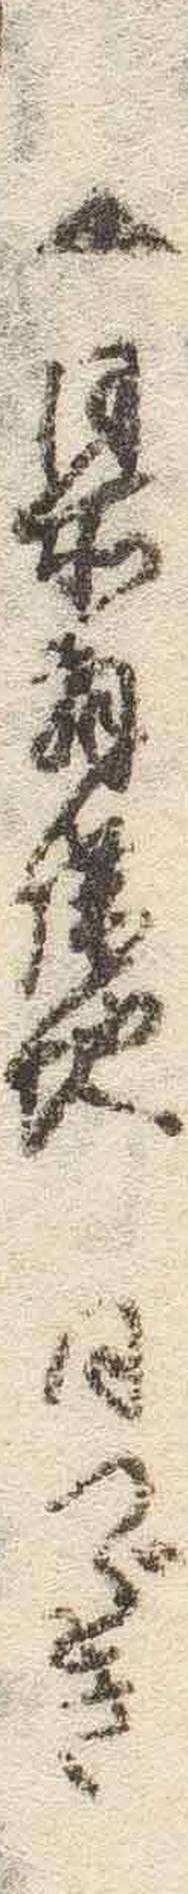▲同所拝借地同つゞき
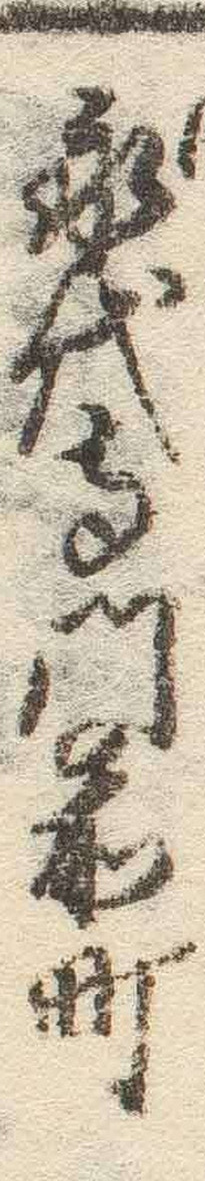永代寺門前町
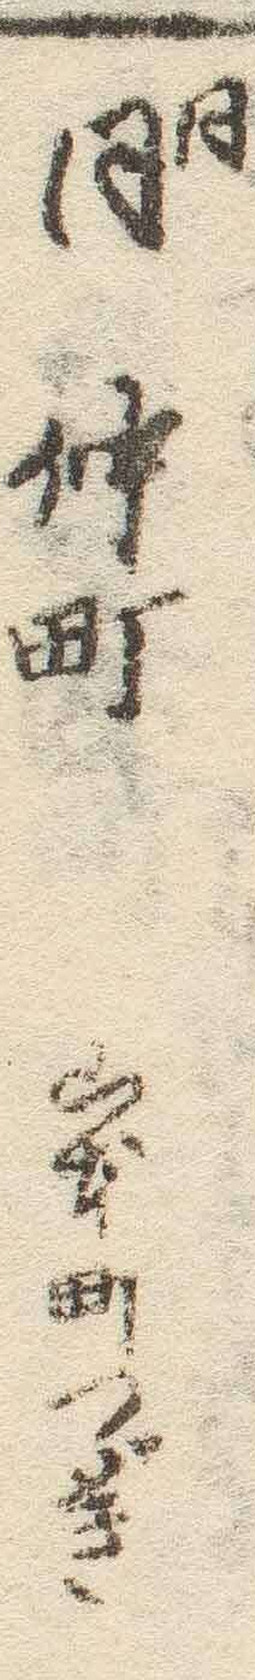同仲町山本町つゞき
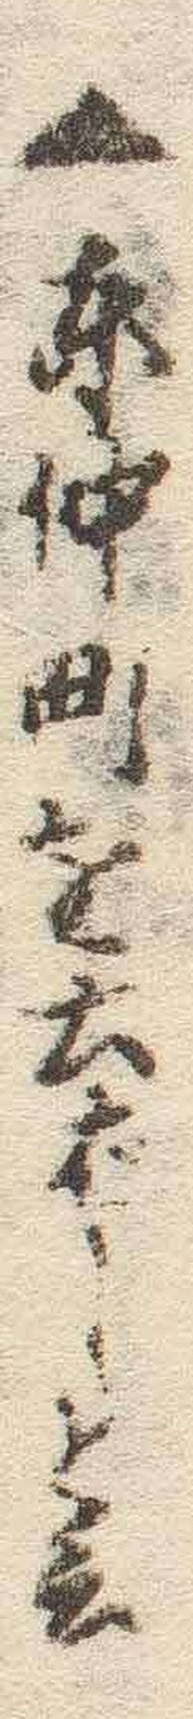▲東仲町を土ばしと云
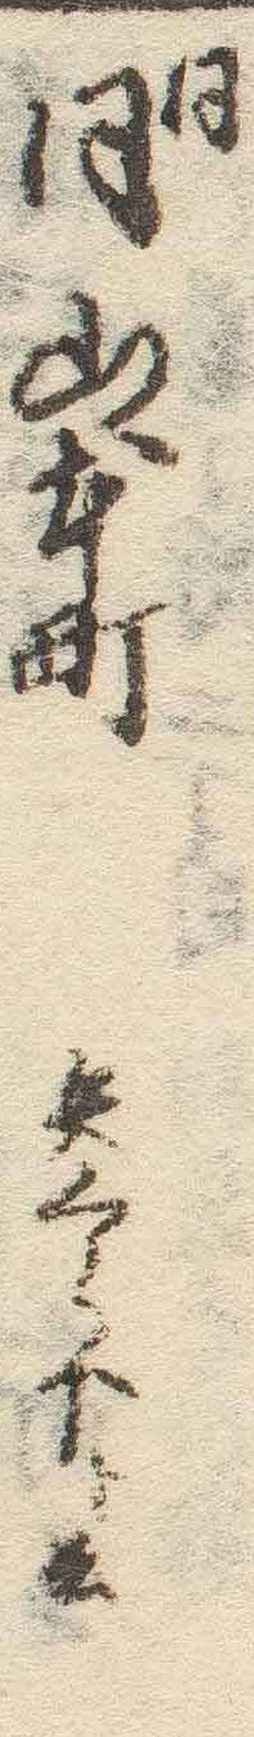同山本町矢くら下ト云
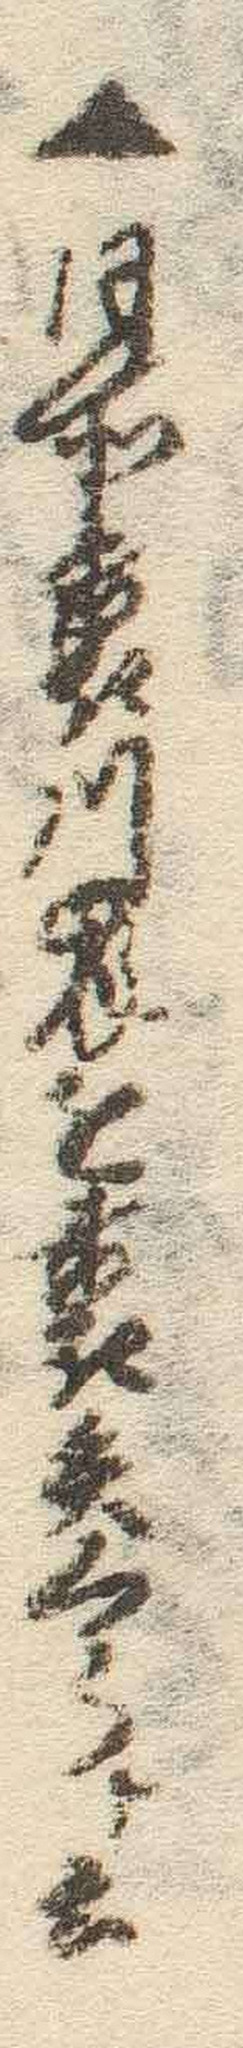▲同所裏川岸を裏矢くらト云
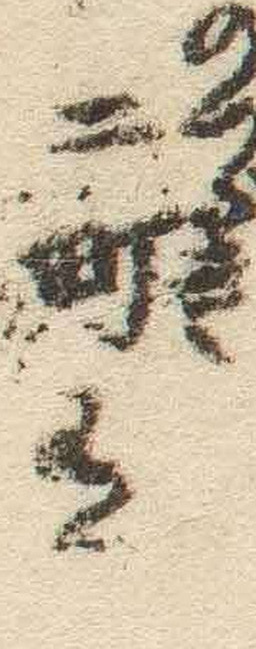二町有
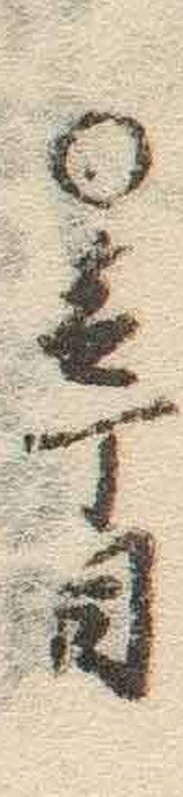○壱丁目
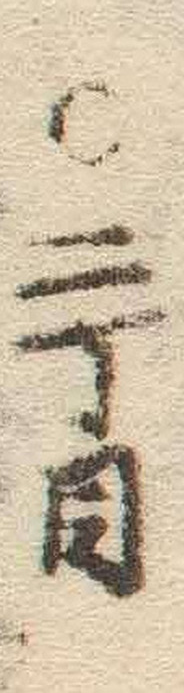○二丁目
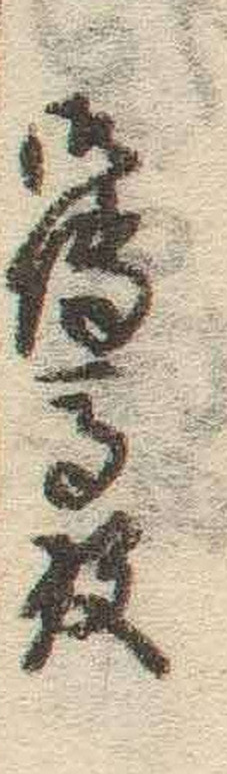御伝馬役

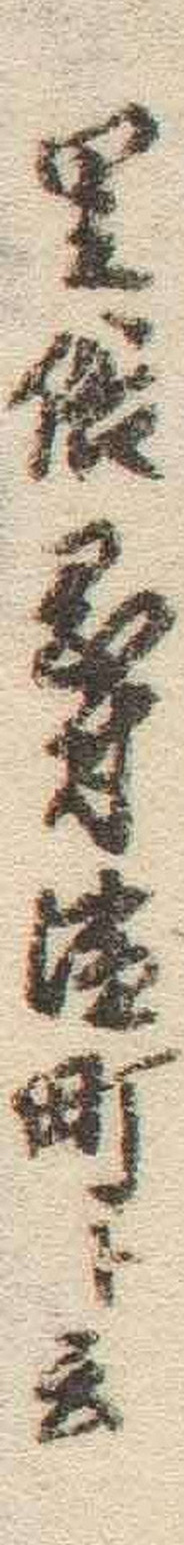里俗岡付塩町ト云
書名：江戸町独案内
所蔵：東京学芸大学附属図書館 国文学研究資料館
